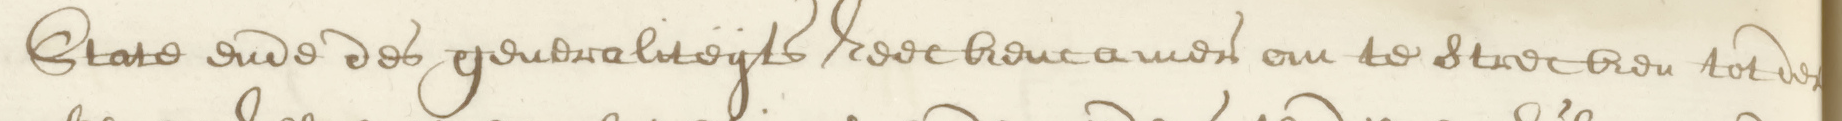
State ende des generaliteijts Reeckencamer om te strecken tot de
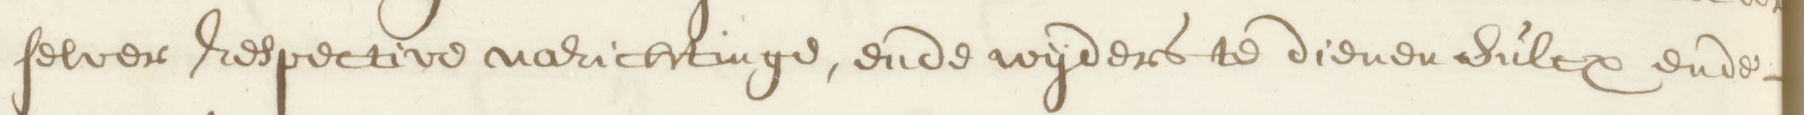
selver respective narichtinge, ende wijders te dienen Sulcx ende —
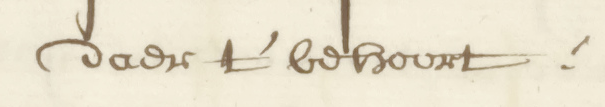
daer t' behoort:
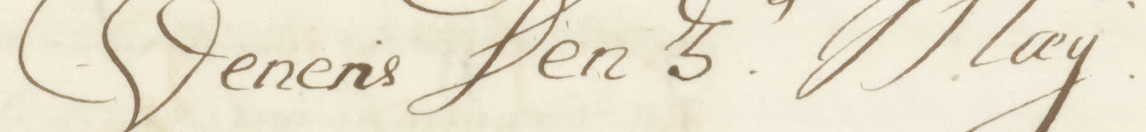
Veneris Den 3en. Maij
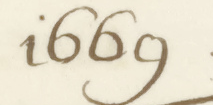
1669
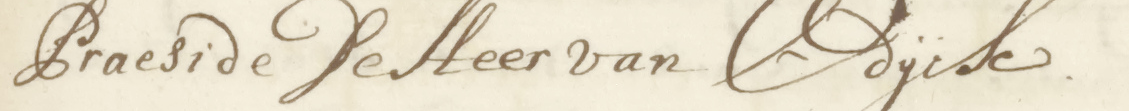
Praeside de Heer van Odijk,
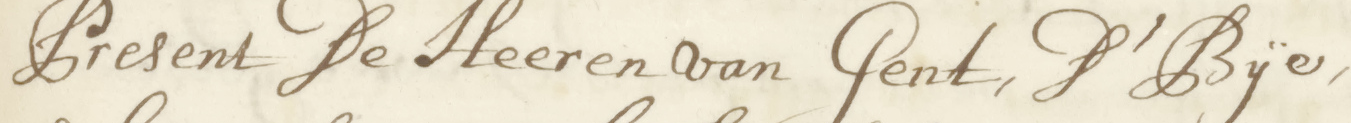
Present De Heeren van Gent, D' Bije,
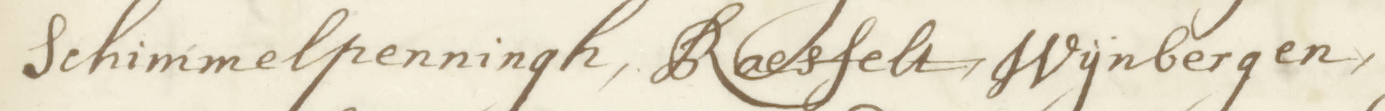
Schimmelpenningh, Raesfelt, Wijnbergen,
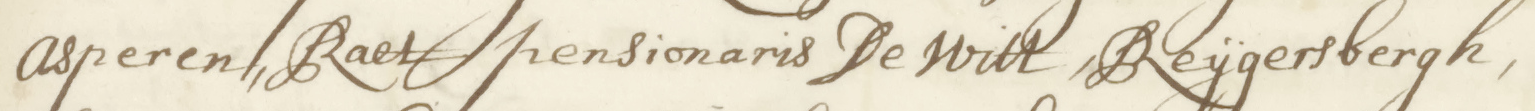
Asperen, Raet pensionaris De Witt, Reijgersbergh,
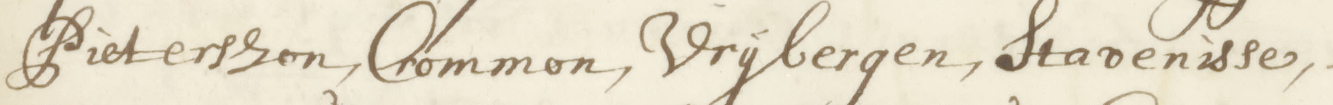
Pieterszon, Crommon, Vrijbergen, Stavenisse,
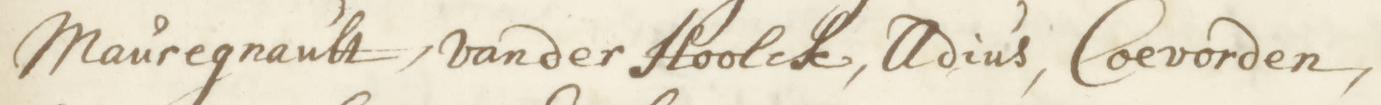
Mauregnault, van der Hoolck, Adius, Coevorden,
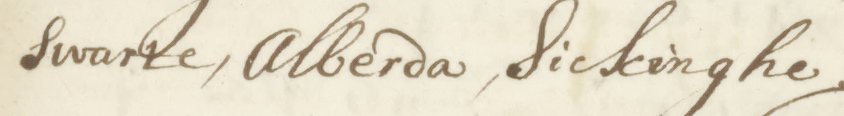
Swarte, Alberda, Sickinghe. —
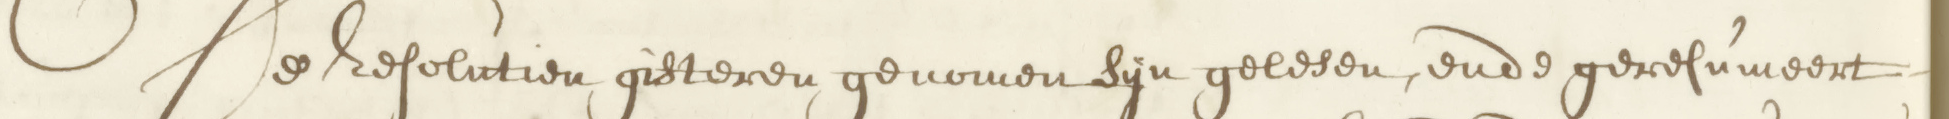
De resolutien gisteren genomen sijn gelesen, ende geresumeert,
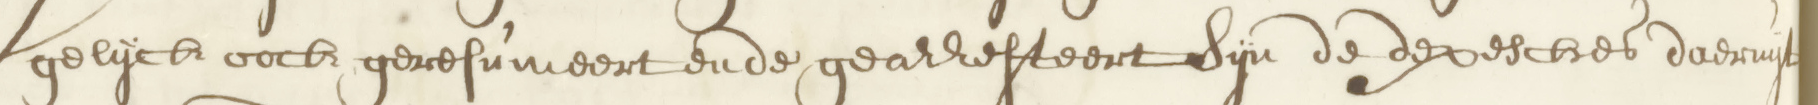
gelijck oock geresumeert ende gearresteert Sijn de depesches daeruijt
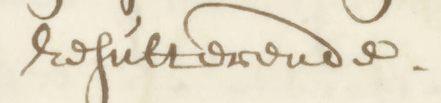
resulterende.
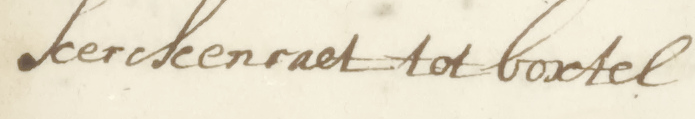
kerckenraet tot boxtel
